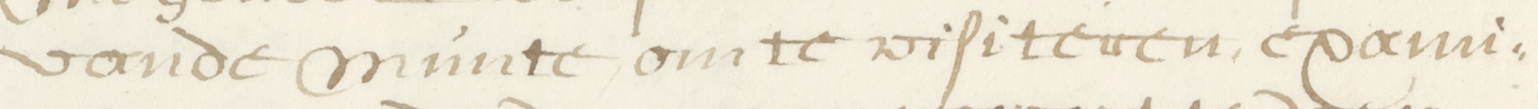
vande munte om te visiteren, exami,,
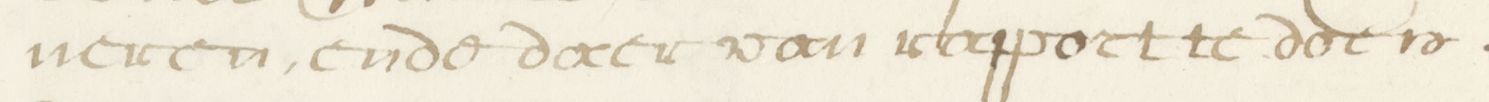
neren, ende daer van rapport te doen.
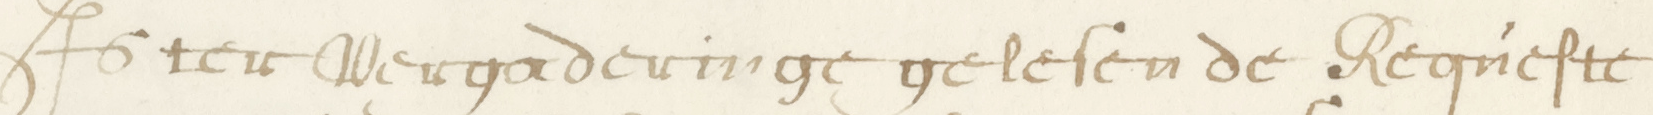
Is ter Vergaderinge gelesen de Requeste
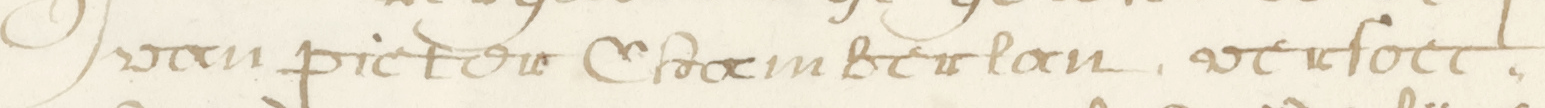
van pieter Chamberlan, versoec,,
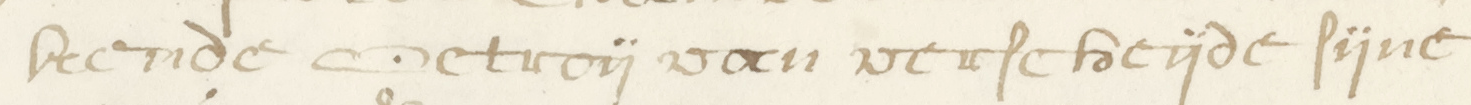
kende Octroij van verscheijde sijne
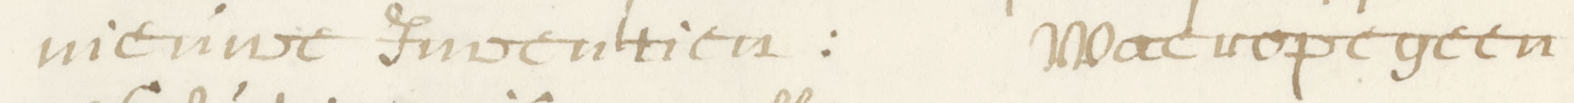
nieuwe Inventien: Waerop egeen
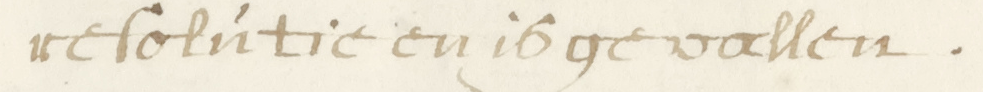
resolutie en is gevallen.
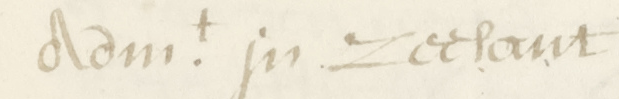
Admt. In zeelant
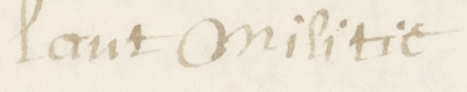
lant militie
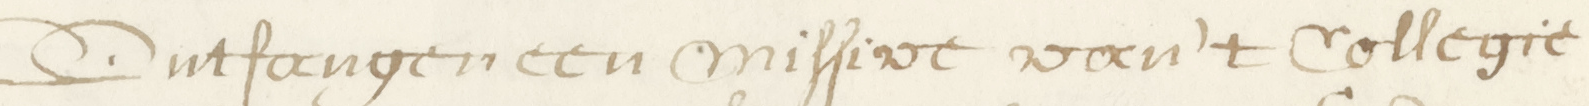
Ontfangen een missive van't Collegie
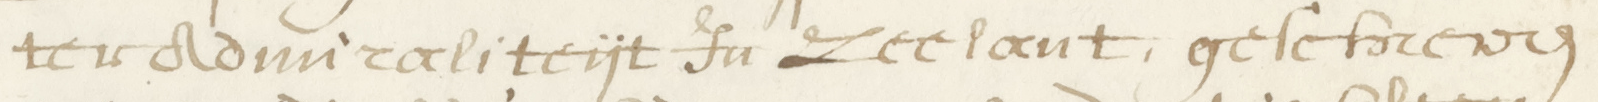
ter Admiraliteijt in Zeelant, geschreven
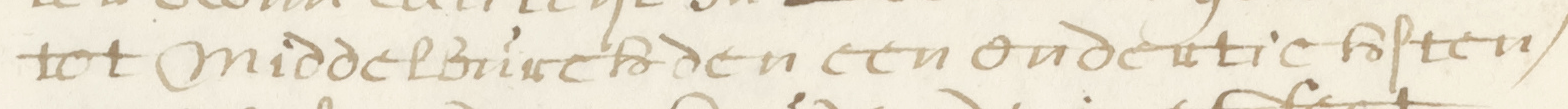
tot middelburch den eenendertichsten
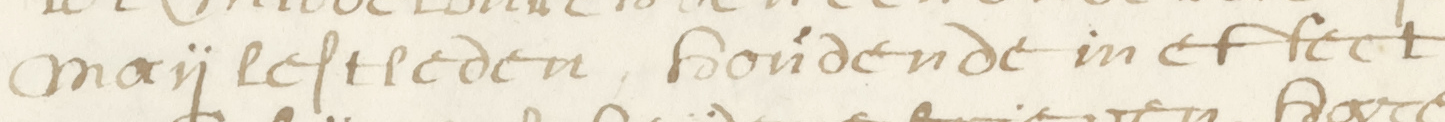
maij lestleden houdende in effect
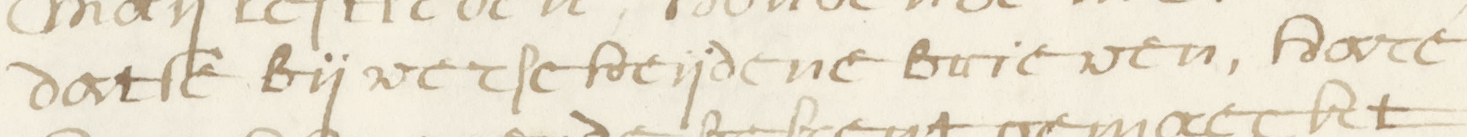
datse bij verscheijdene brieven, hare
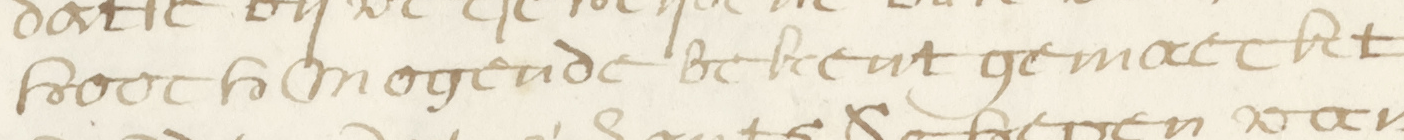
hooch mogende bekent gemaeckt
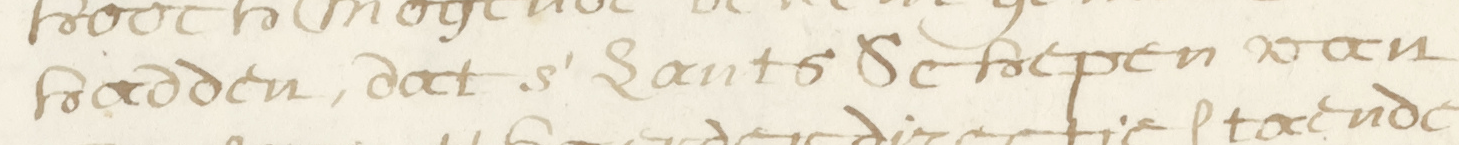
hadden, dat s'Lants Schepen van
